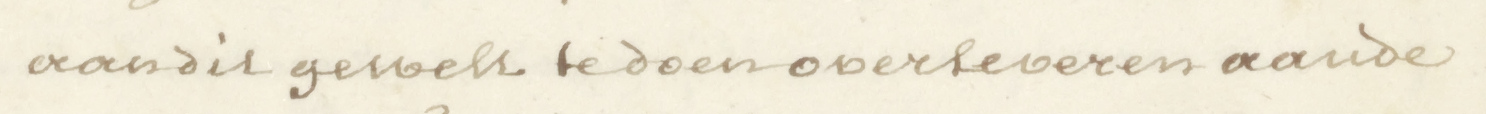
aan dit gewelt te doen overleveren aande
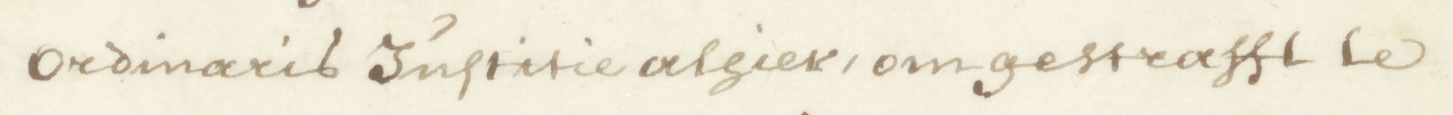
ordinaris iustitie alhier, om gestrafft te
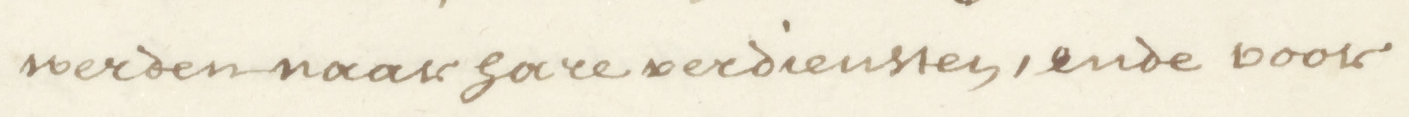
werden naar hare verdiensten, ende voor
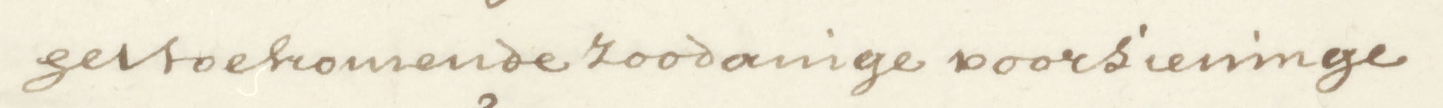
het toekoemende zoodanige voorsieninge
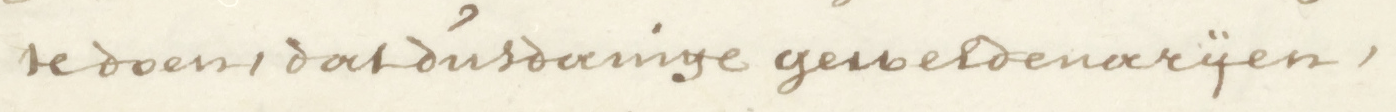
te doen, dat dusdanige geweldenarijen,
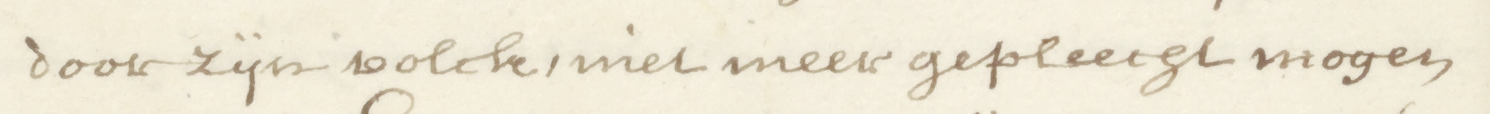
door zijn volck, niet meer gepleecht mogen
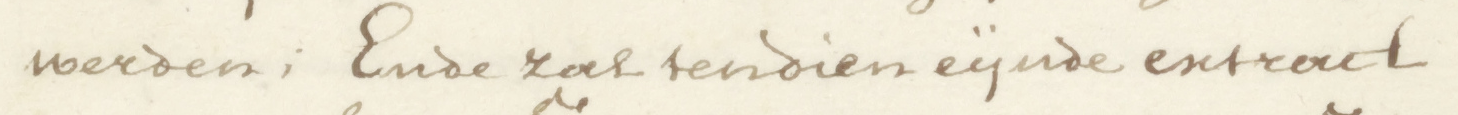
werden; Ende zal tendien eijnde extract
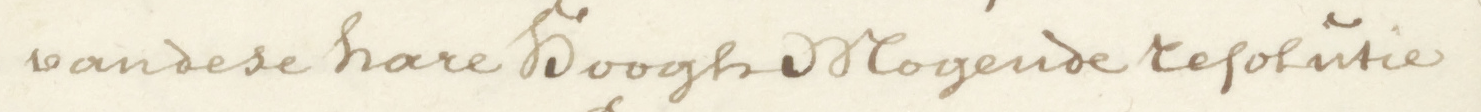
van dese hare Hoogh Mogende resolutie
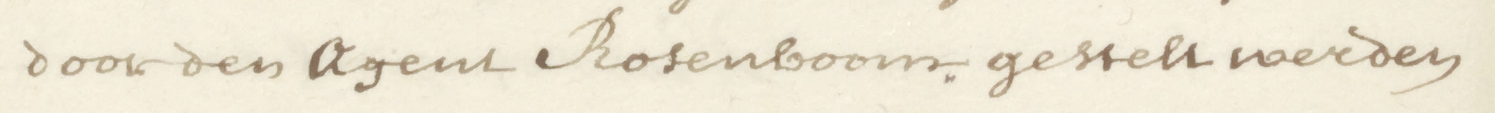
door den agent Rosenboom gestelt werden
